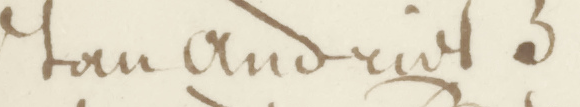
Jan Andriesz
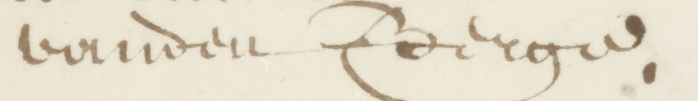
vanden Berge
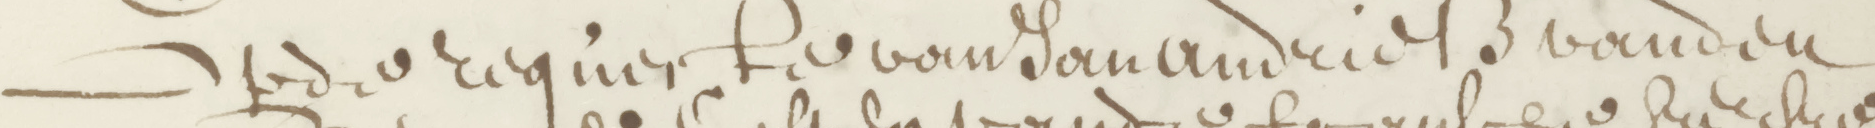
Opde requeste van Jan Andriesz vanden
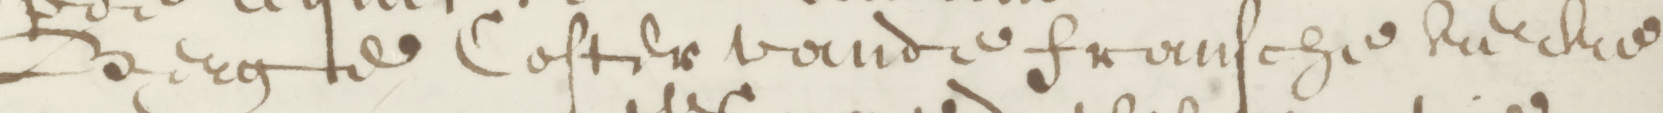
Berge Coster vande fransche kerke
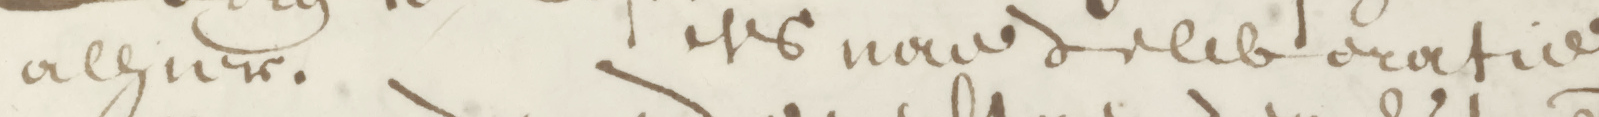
alhier. is nae deliberatie
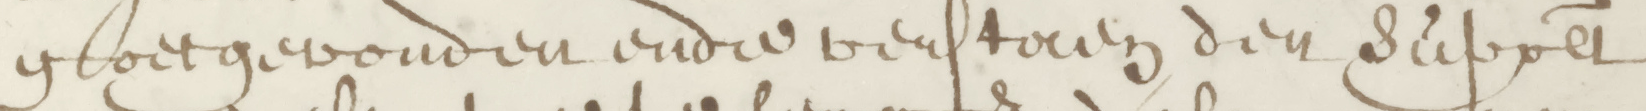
goetgevonden ende verstaen den Supplt
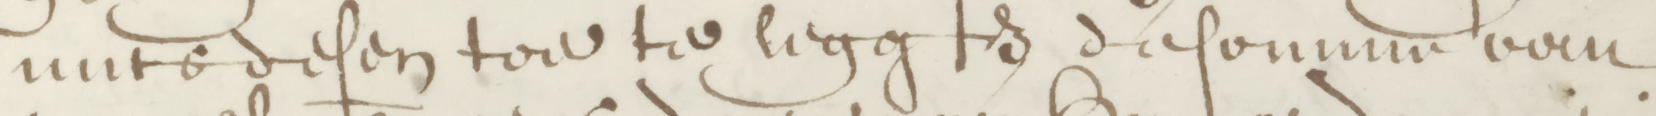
mits desen toe te leggen de somme van
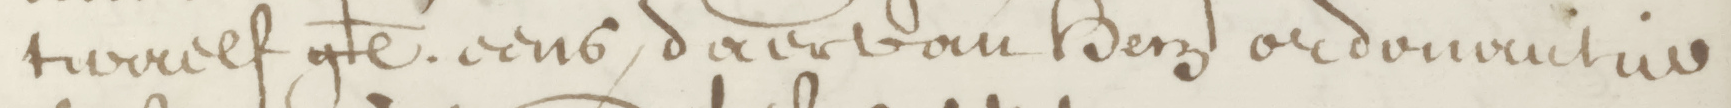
twaelf gl. eens, daervan hem ordonantie
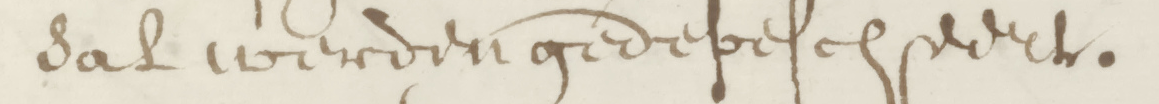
sal werden gedepescheert.
